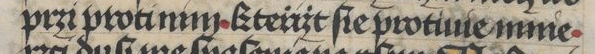przi proti ním.kteṙíżt ſie protiuie mnie.
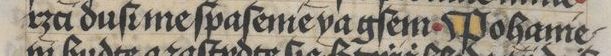rzci duſi me ſpaſeníe ya gſem.Pohaníe¬
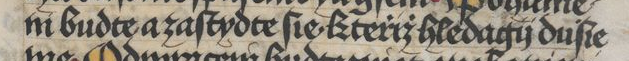ni budte.a zaſtydte ſie.kteṙíż hledagij duẛie
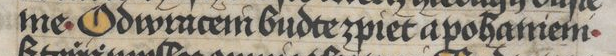me.Odwraceni budte zpiet a pohanieni.
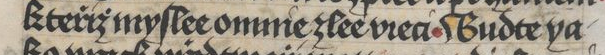kteṙíż myſlee omnie zlee vieci.Budte ya¬
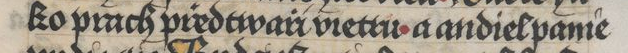ko prach pṙedtwaṙí vietru.a andiel panie
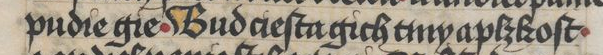pudie gie.Bud cieſta gich tmy a plzkoſt.
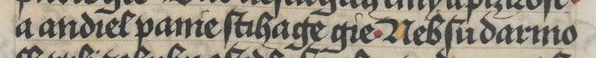a andiel panie ſtihage gie.Neb ſu darmo
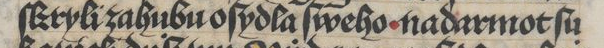ſkryli zahubu oſydla ſweho.nadarmot ſu
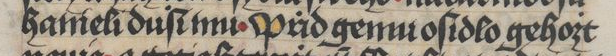hanieli duẛi mu.Pṙid gemu oſidlo gehożt
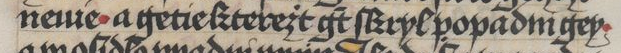neuíe.a getie ktereżt ḡt ſkryl popadni gey.
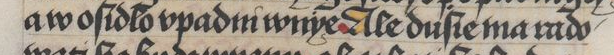a w oſidlo vpadni wnye.Ale duẛie ma rado¬
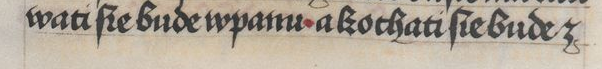wati ſie bude wpanu.a kochati ſie bude z
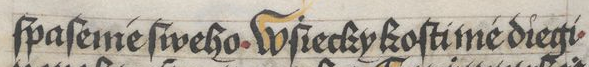ſpaſeníe ſweho.Wẛiecky koſti mé diegí.
